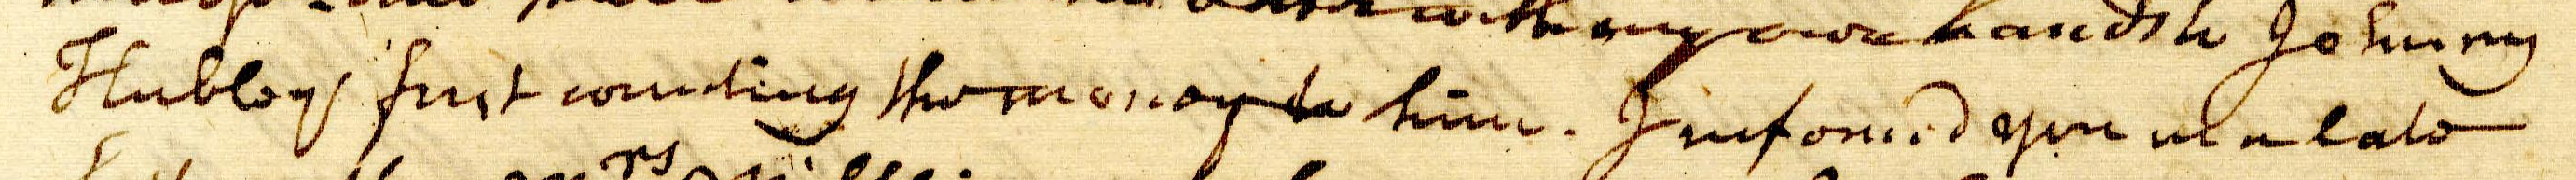Hubley first counting the money to him. I informed you in a late
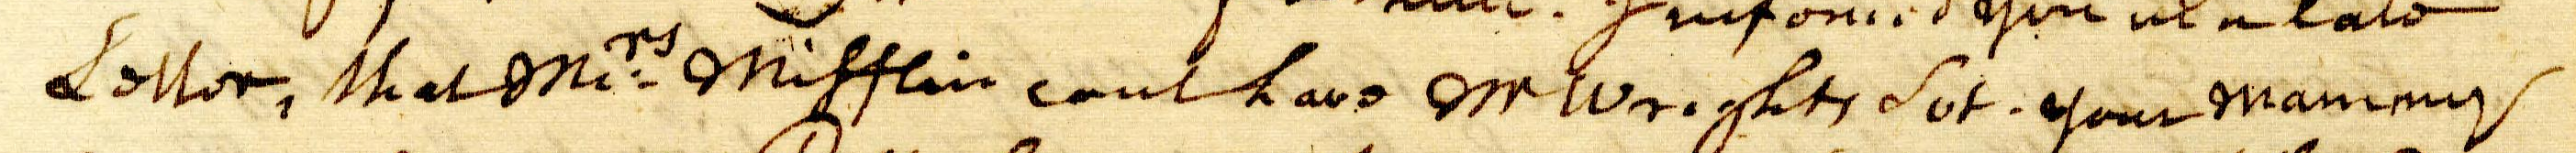Letter, that M^rs: Mifflin cant have M^r Wrights Lot. Your Mammy
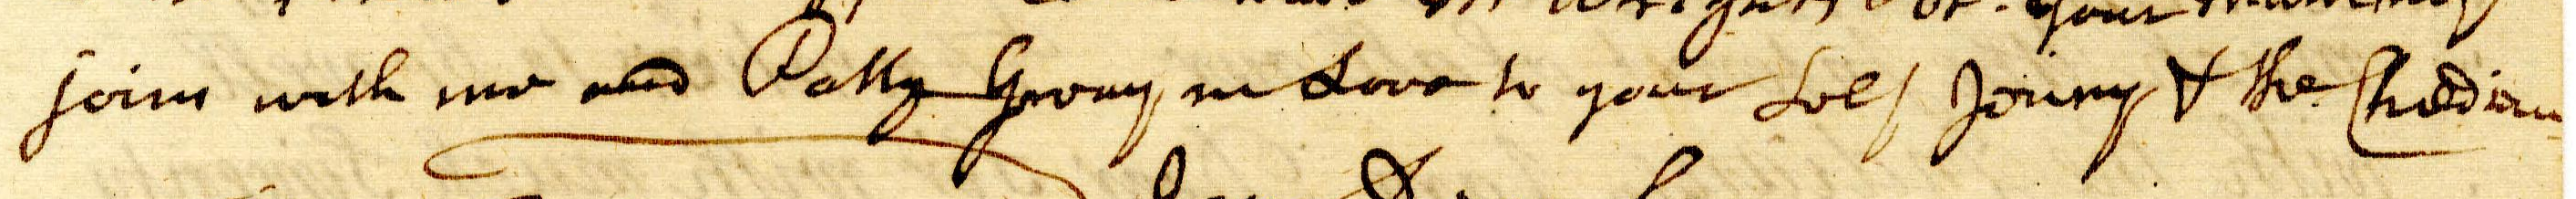joins with me and Patty Gray in Love to your Self Jenny & the Children
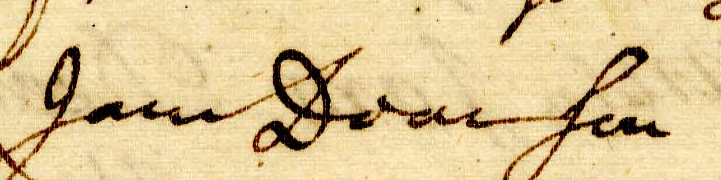I am Dear Son
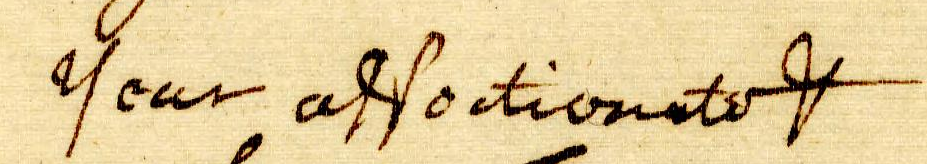Your affectionate &
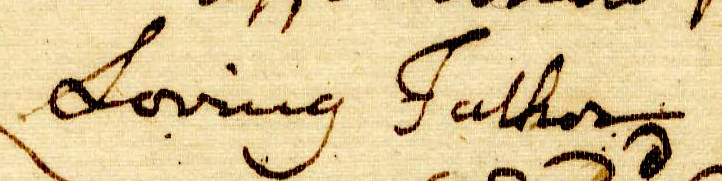Loving Father
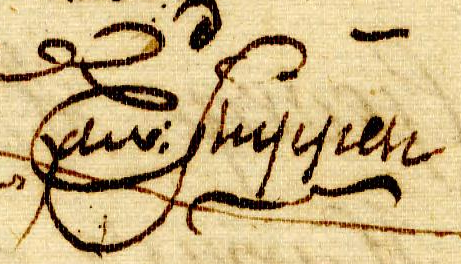Edw:^d Shippen
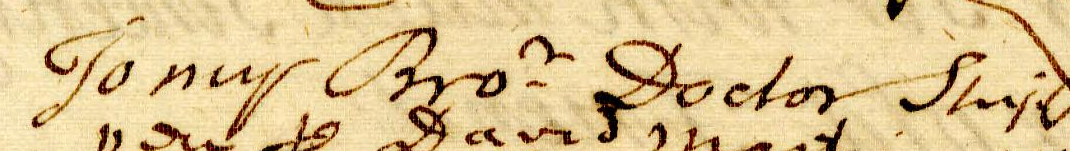To my Bro^r Doctor Ship
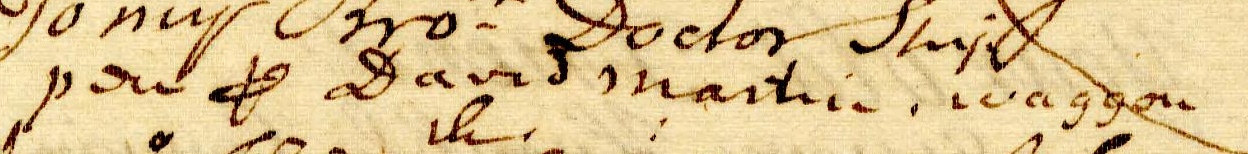per per David Martin waggon
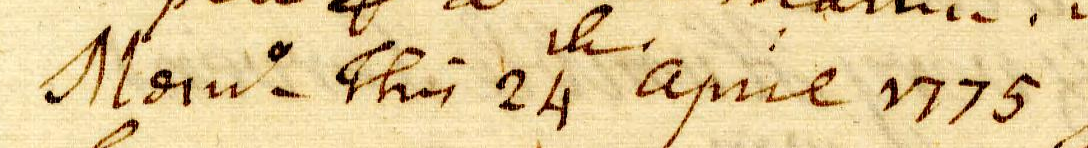Morn^g- This 24^th. April 1775
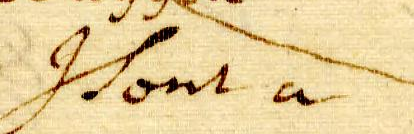I Sent a
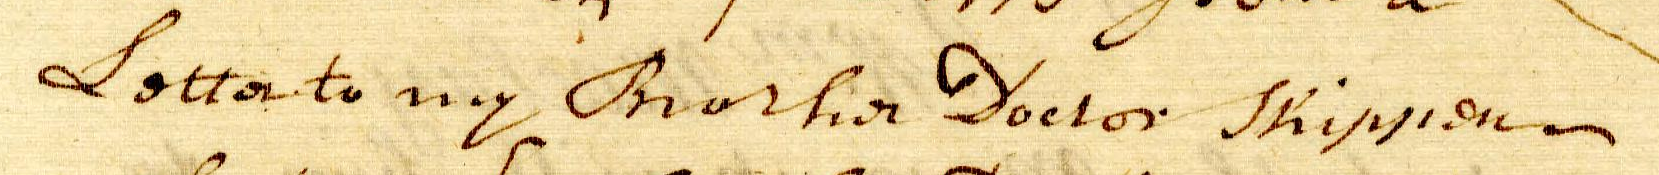Letter to my Brother Doctor Shippen-
